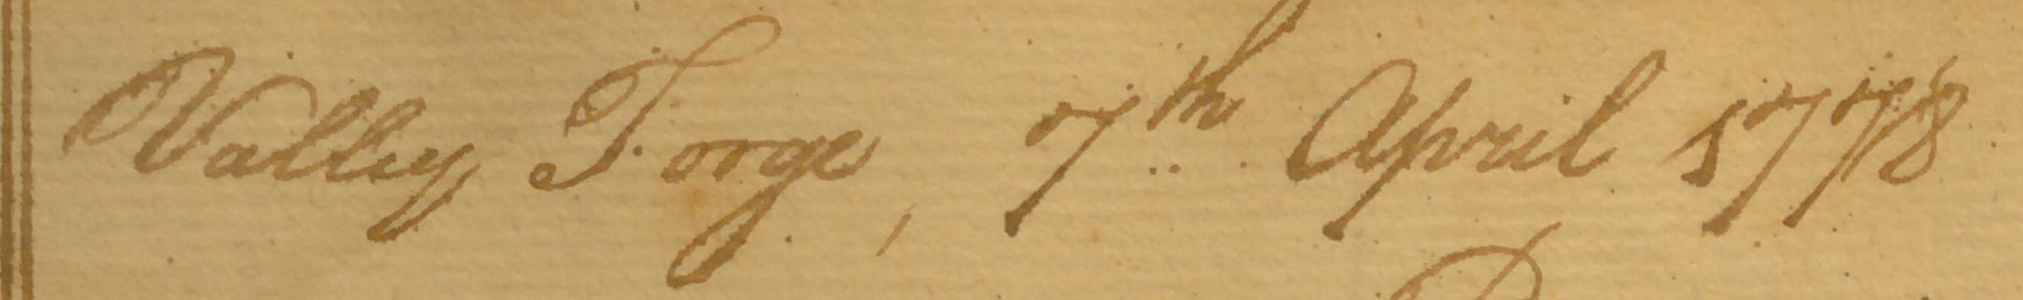Valley Forge, 7^th. April 1778
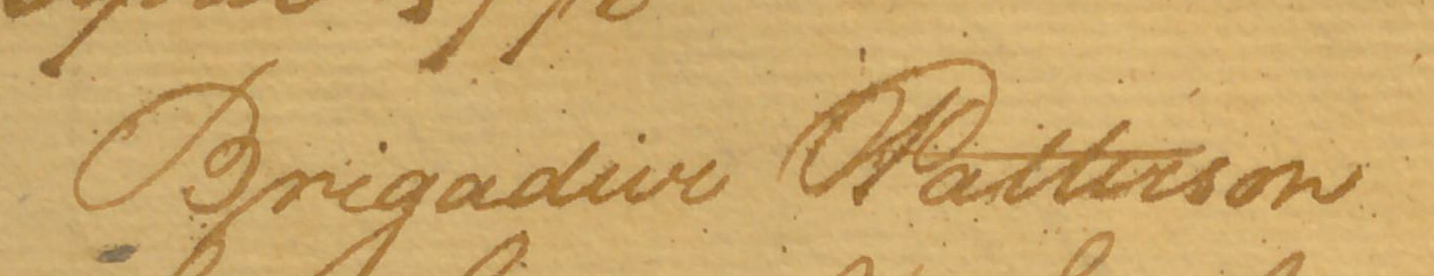Brigadier Patterson
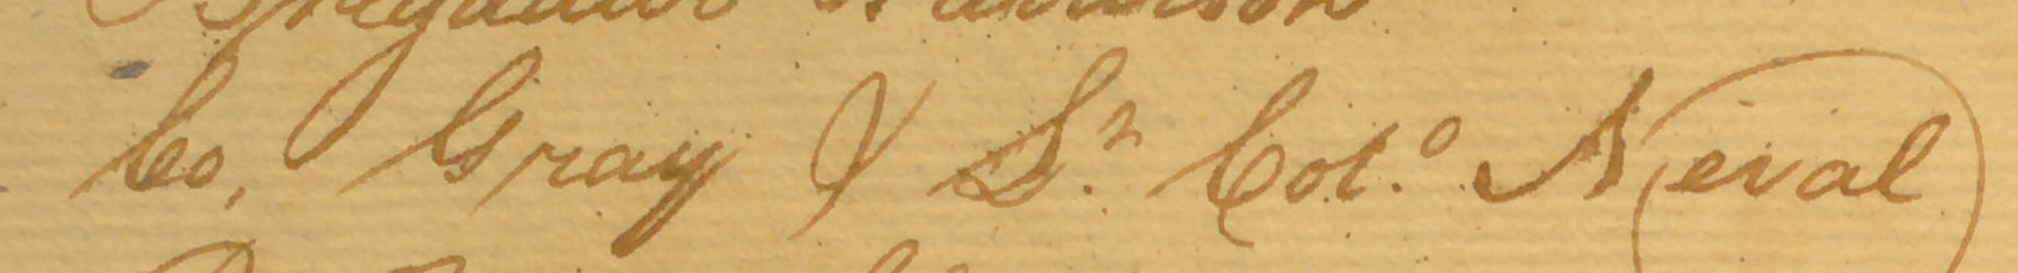Co. Gray & L^t. Col^o. Neval
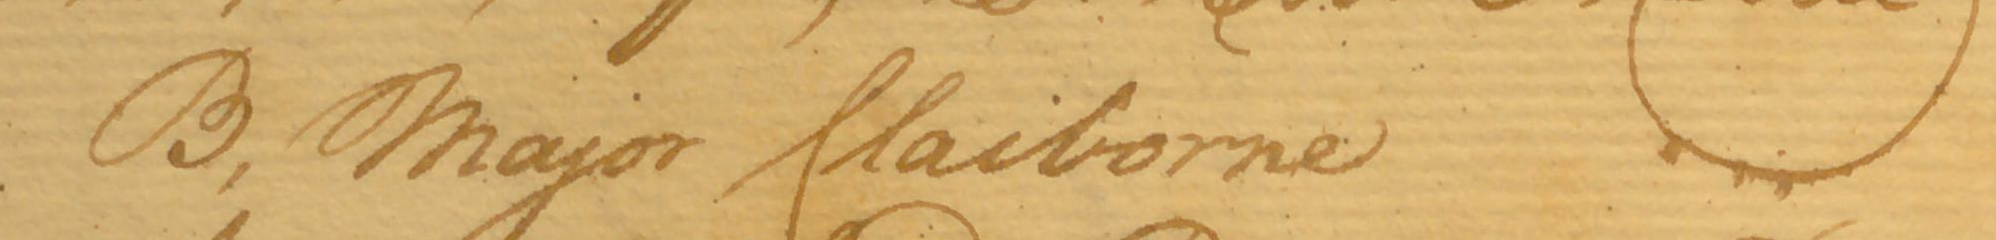B. Major Claiborne
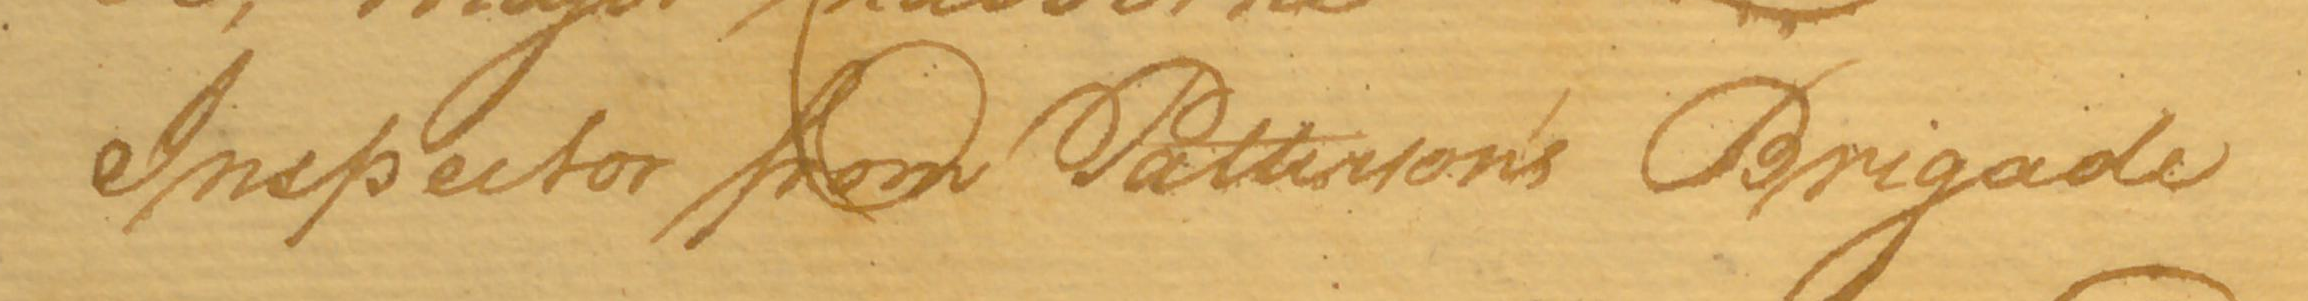Inspector from Patterson's Brigade
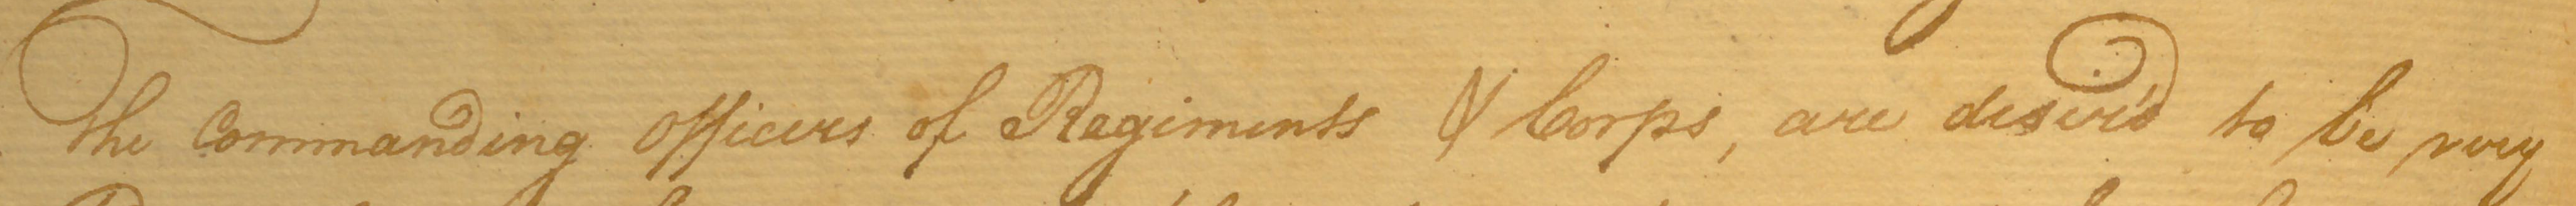The Commanding officers of Regiments & Corps, are desir'd to be very
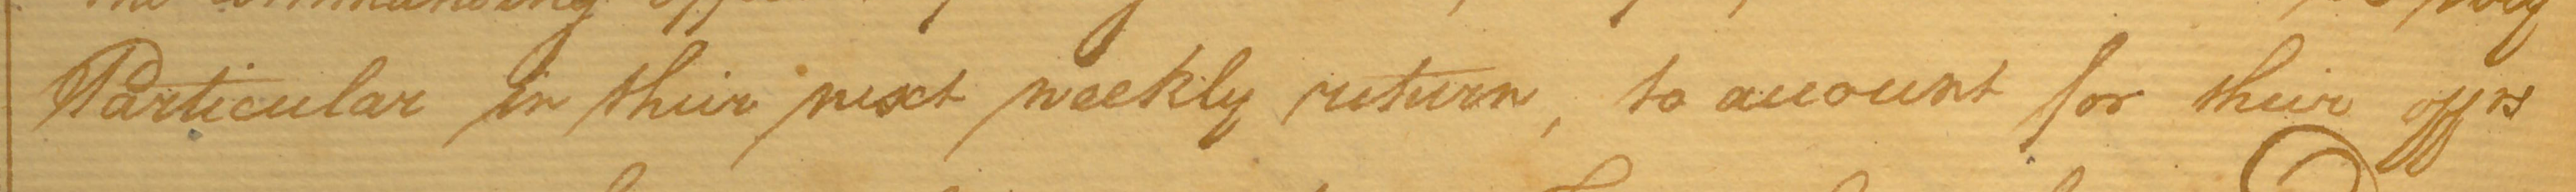Particular in their next weekly return, to account for their offrs
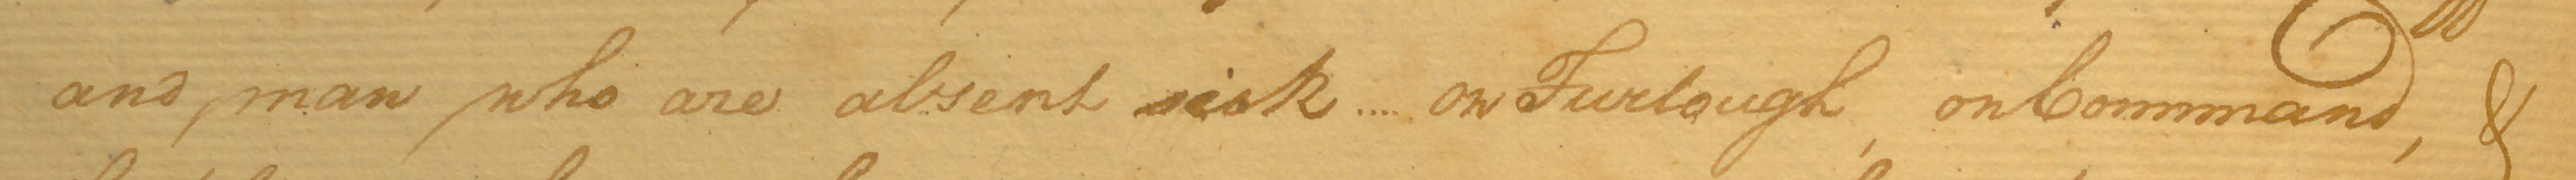and man who are absent sick.... on Furlough, on Command, &
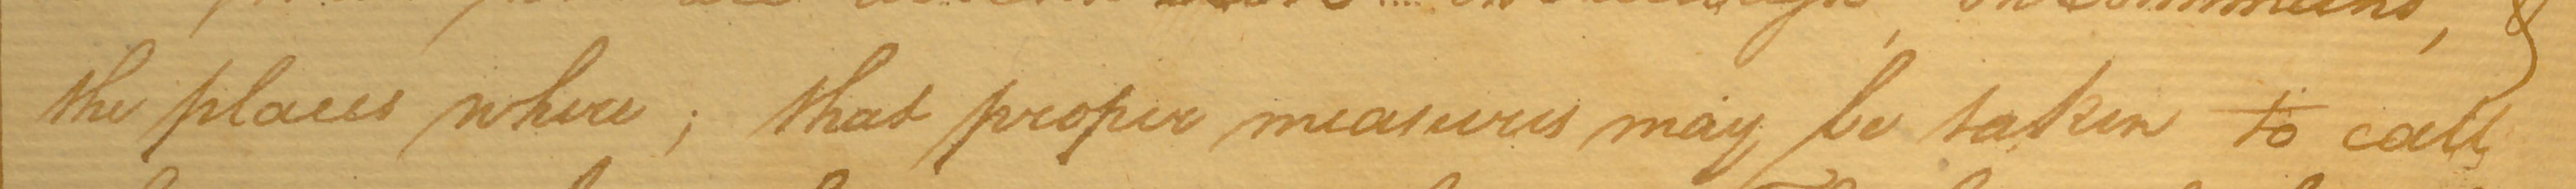the places where; that proper measures may be taken to call
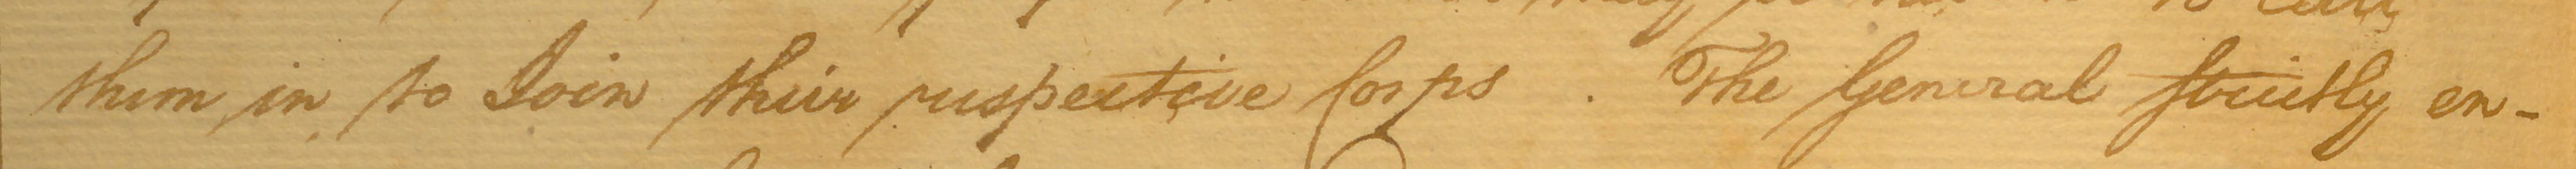them in to Join their respective Corps. The General strictly en-
